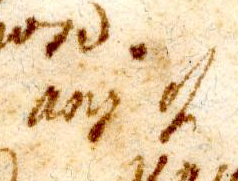any of
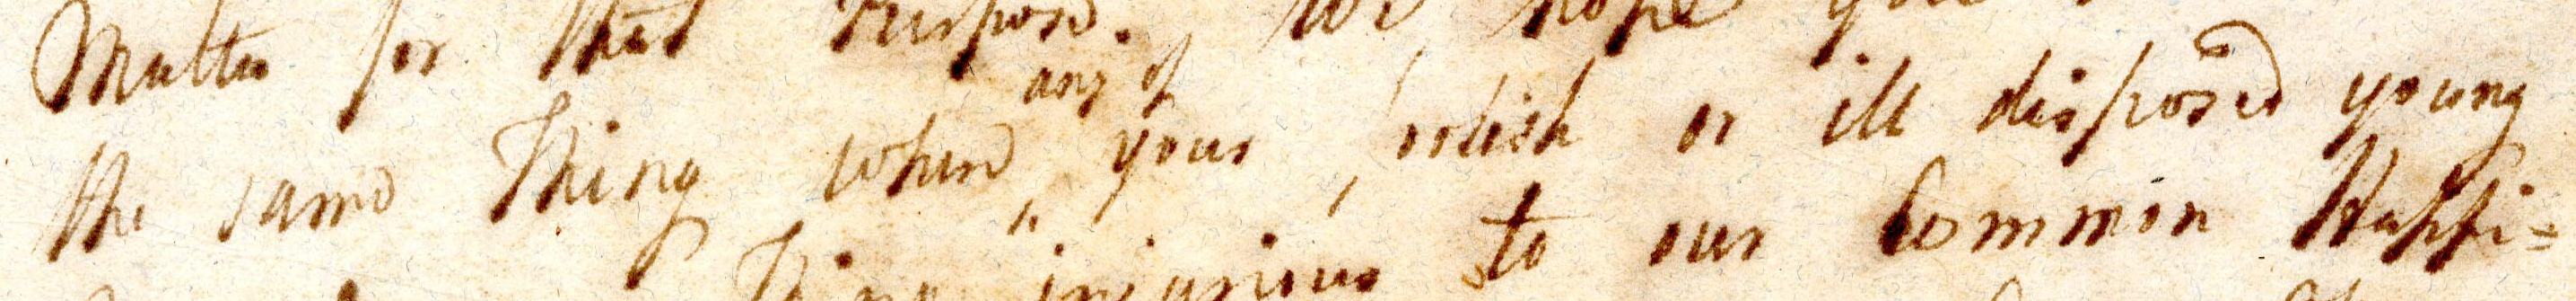the same Thing when^ your foolish or ill disposed young
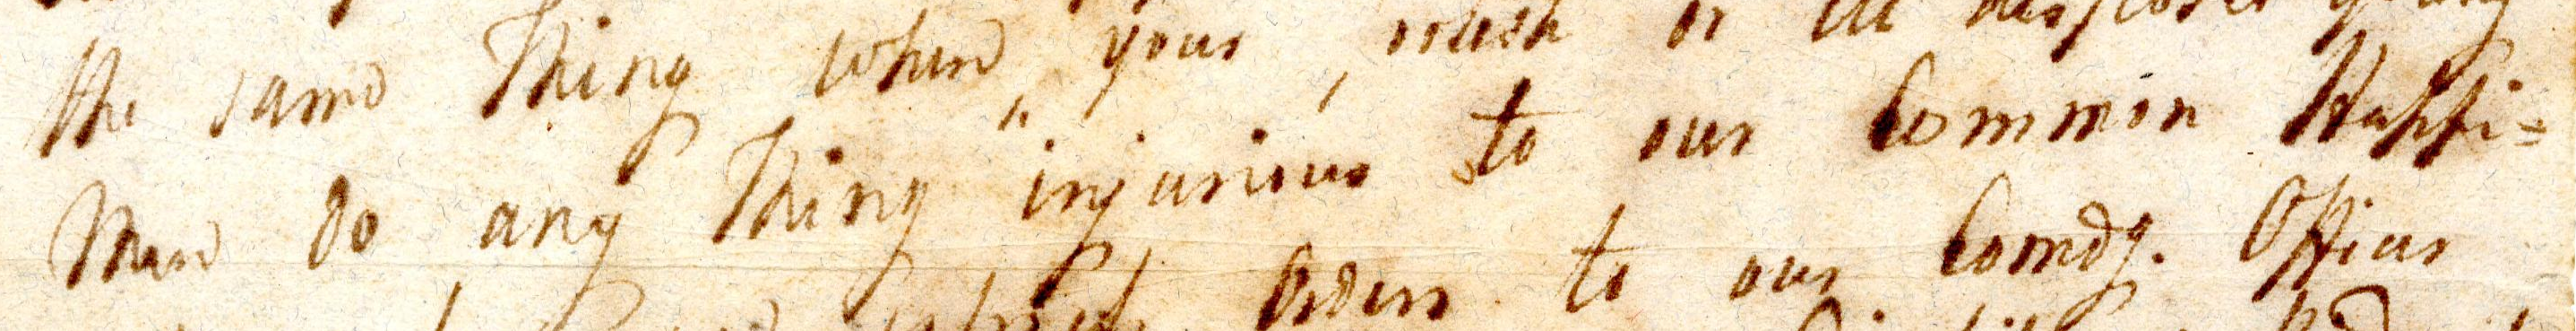Men do any thing injurious to our Common Happi-
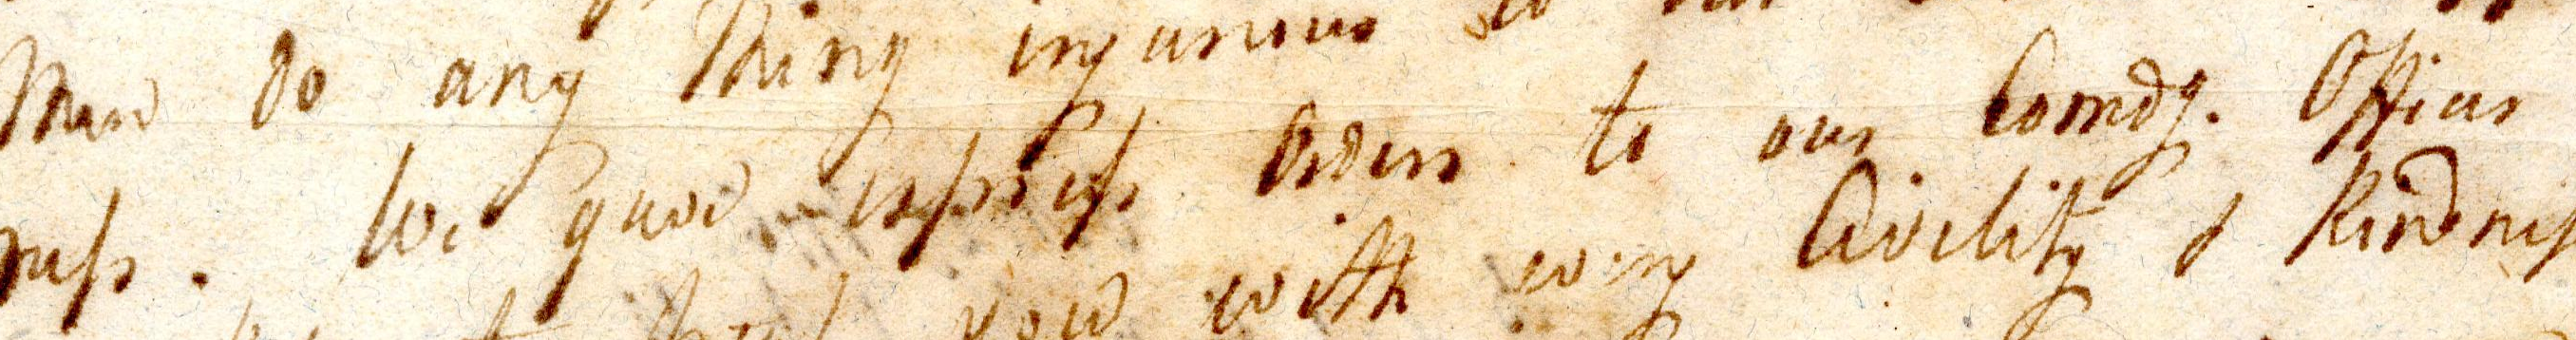ness. We gave express Orders to our Comd^g. Officer
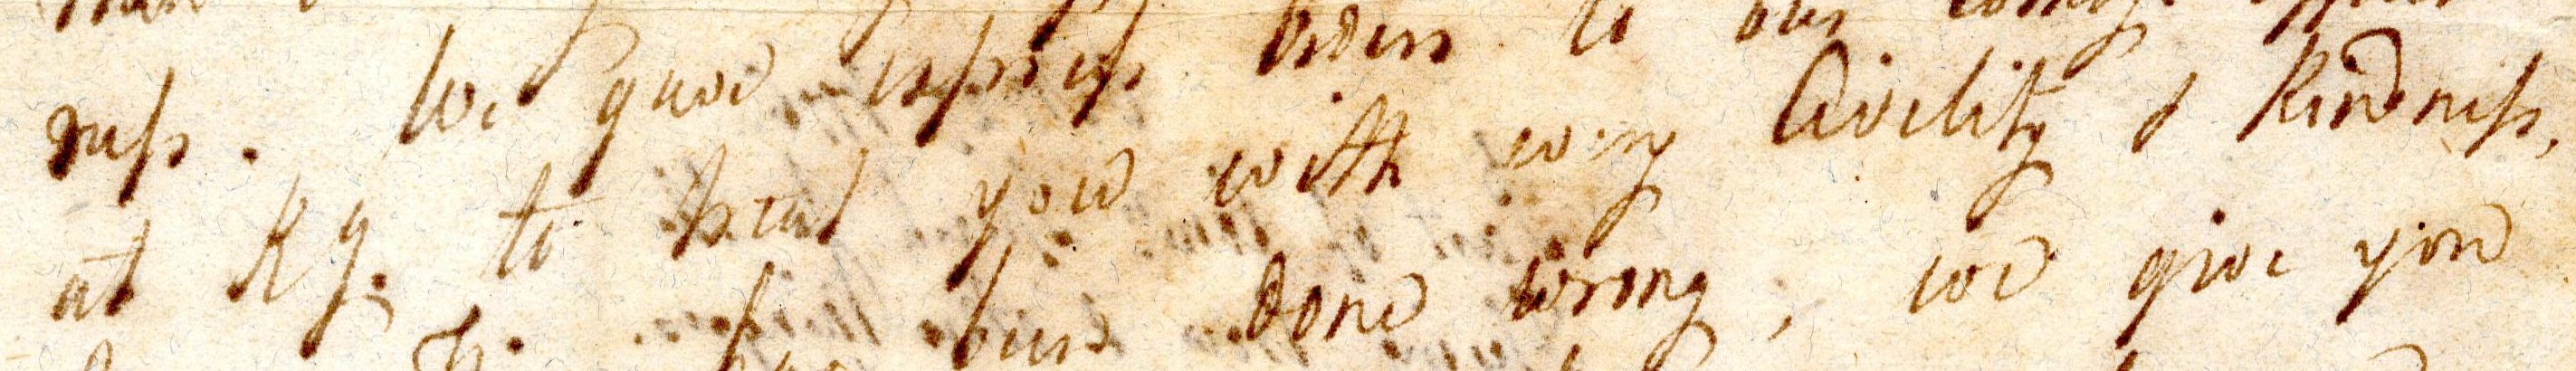at K^g. to treat you with every Civility & Kindness.
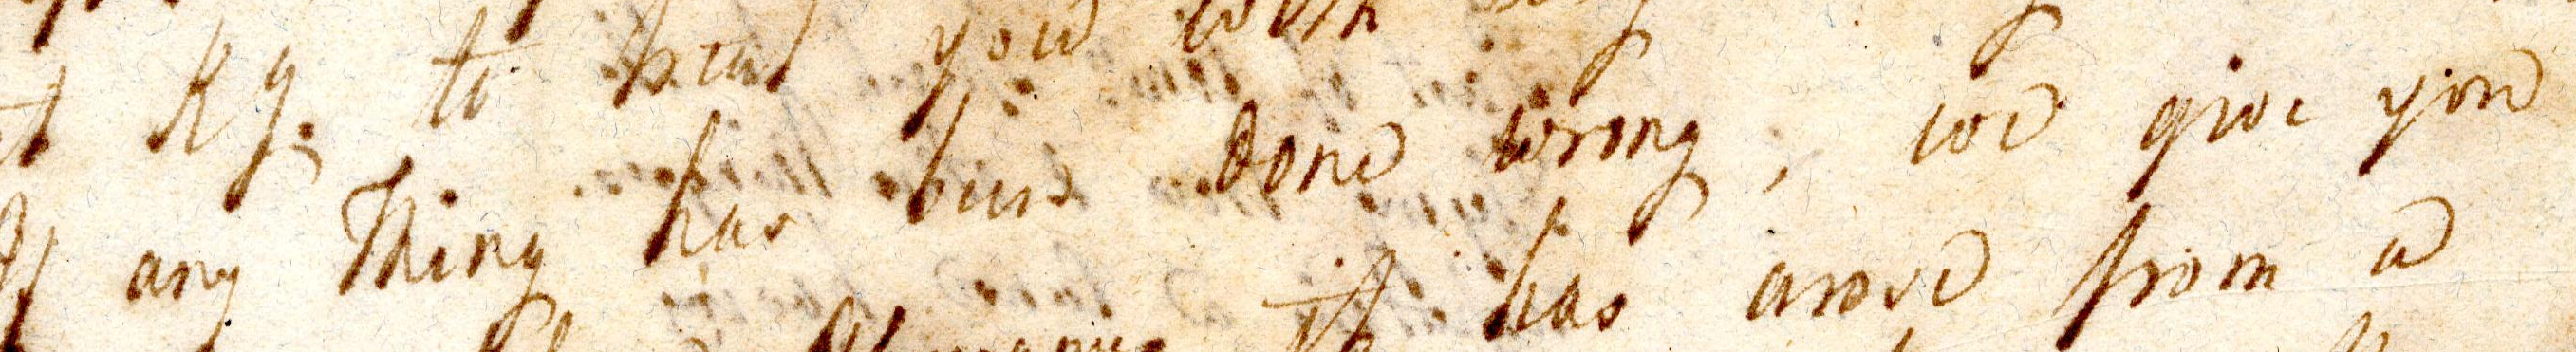If any Thing has been done wrong, we give you
